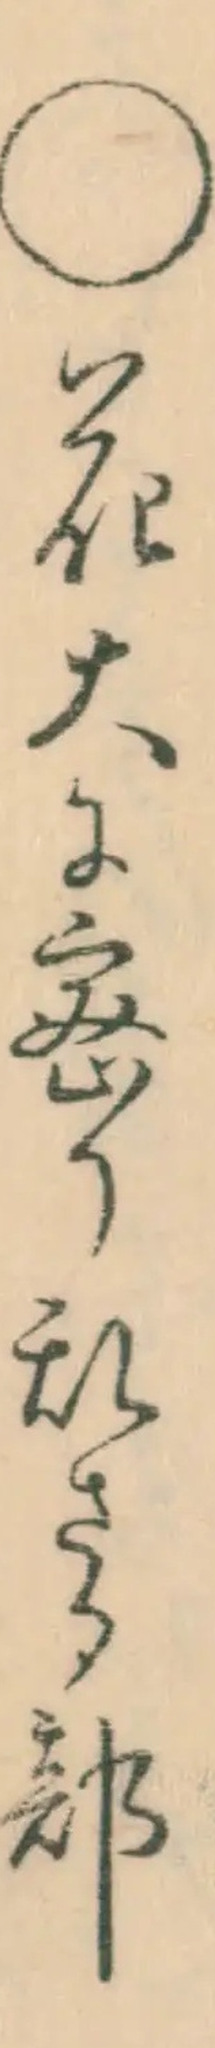○花大に密り乱さくの部
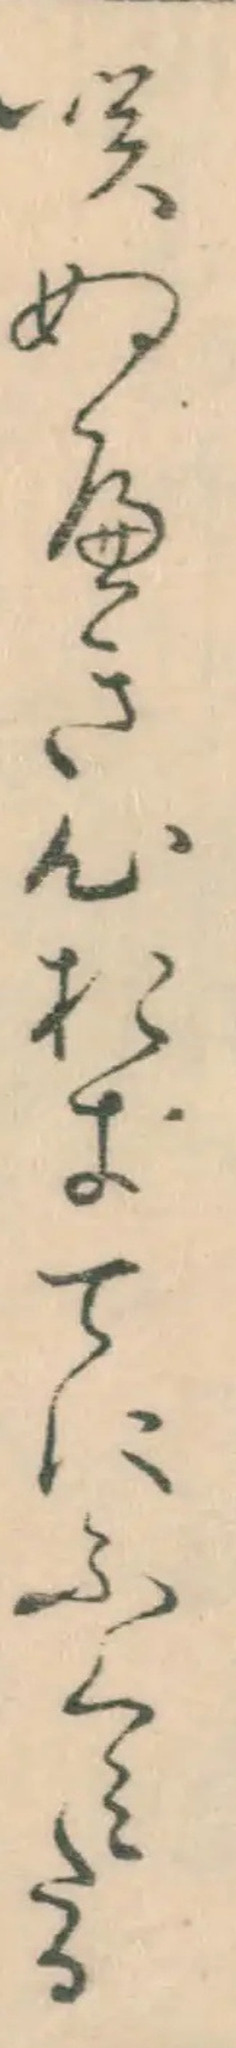咲ぬへき心おきてにふくみたる
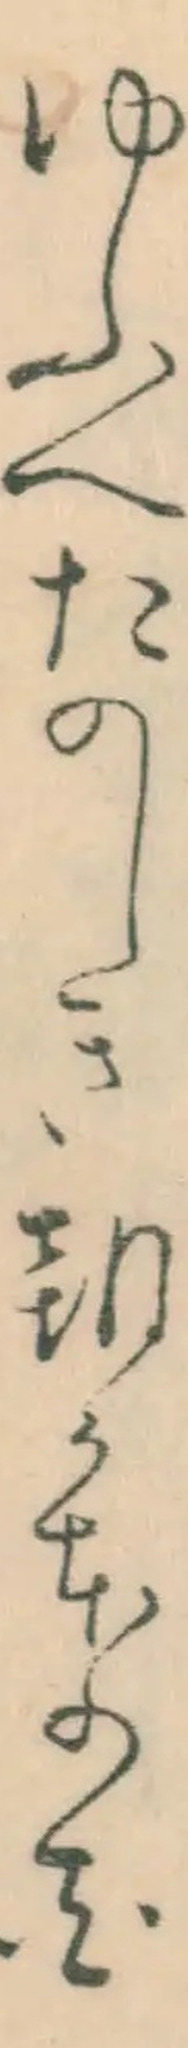ゆふへたのしき朝かほの花郷

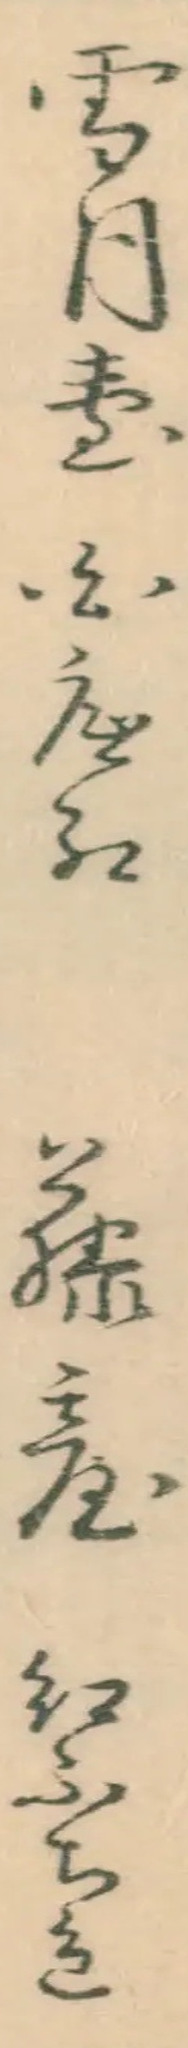雪月台花薄紅藤台紅ふち色
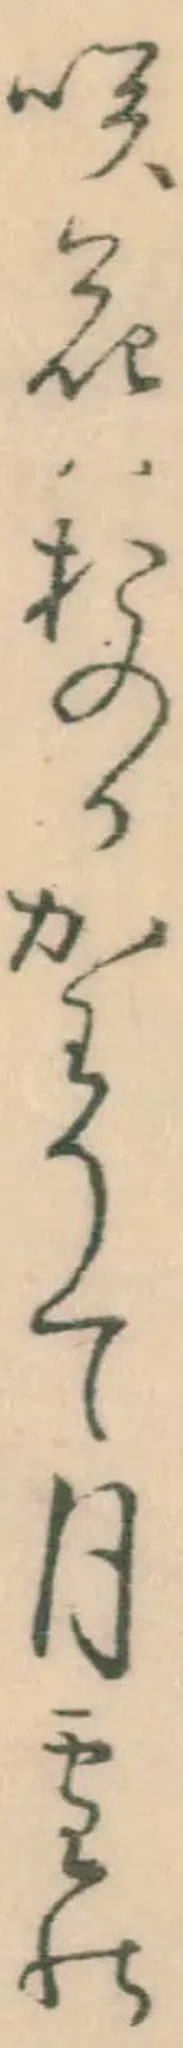咲花はおのかかわりて月雪の
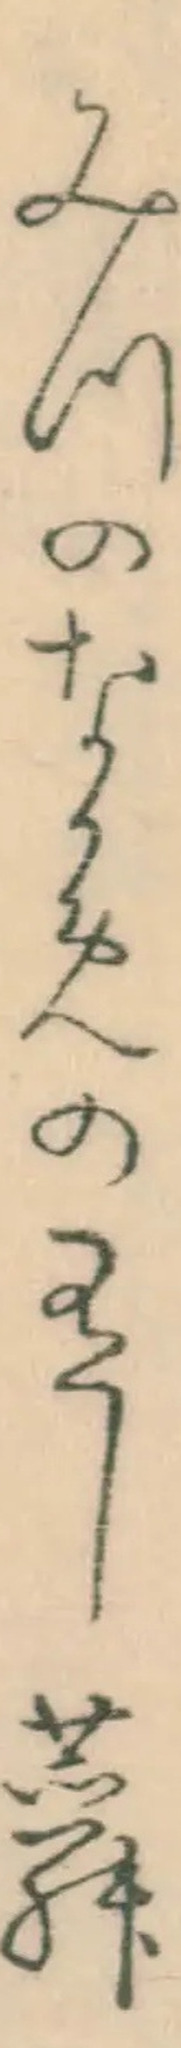みつのなかめの有し蕣鳩丸
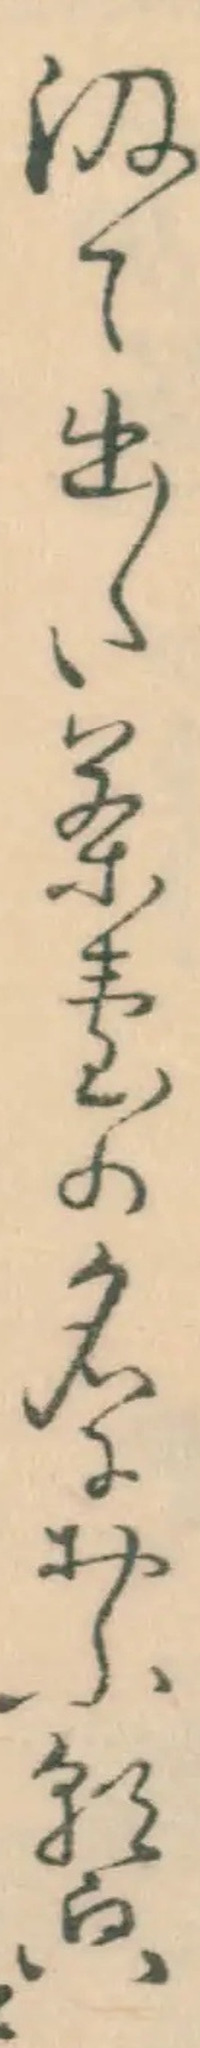汲て出た茶台の名におふ朝皃は
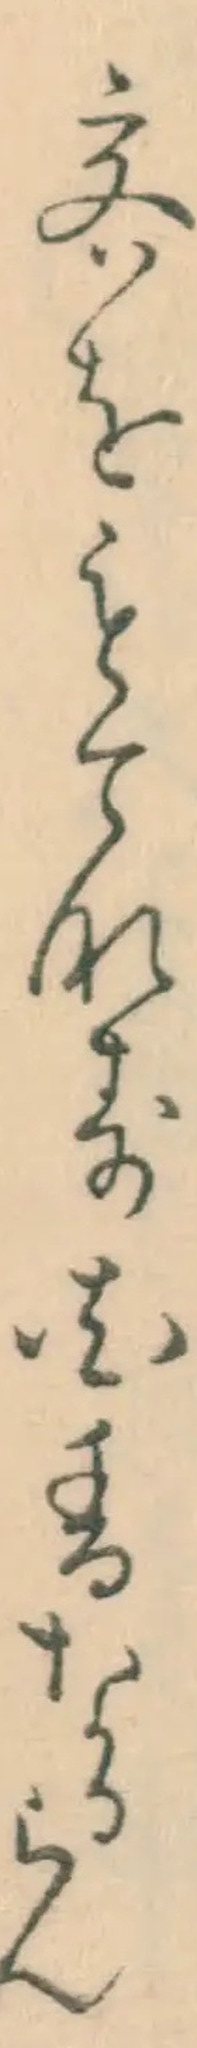客をもてなす花香なるらん丸
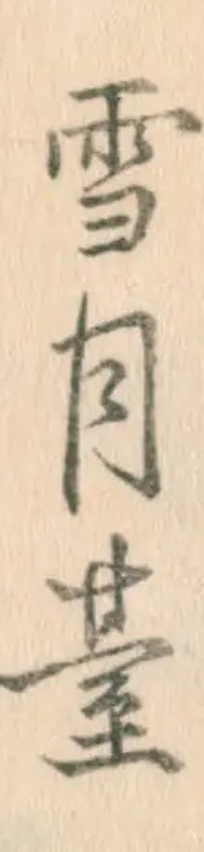雪月臺

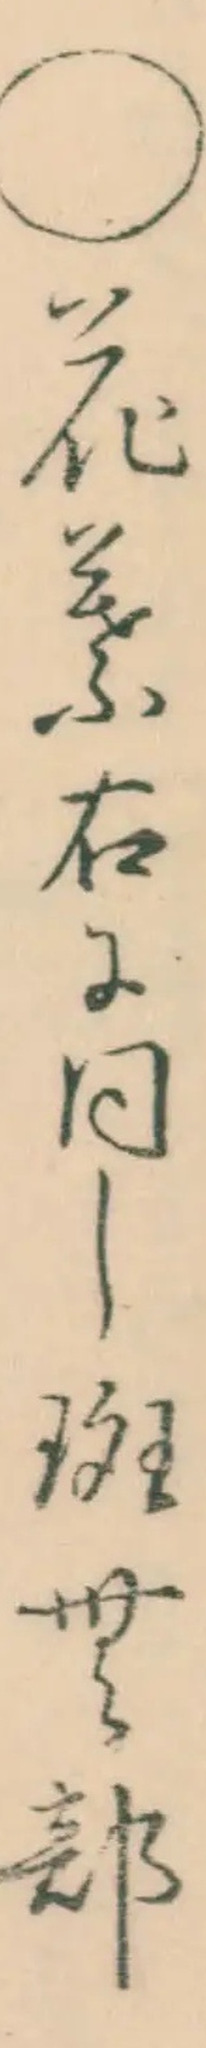○花葉右に同し斑無部
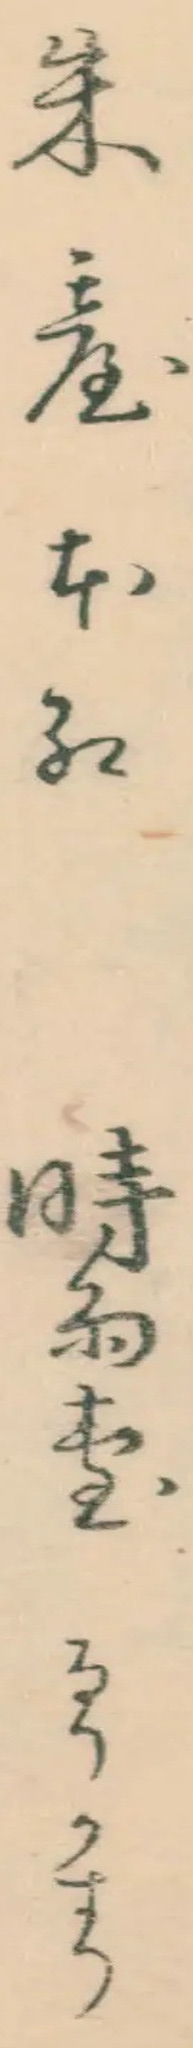朱台本紅時雨台るりかすり

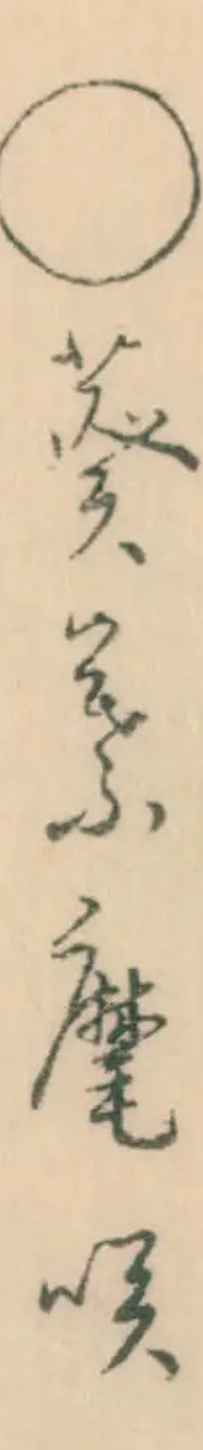○葵葉麾咲
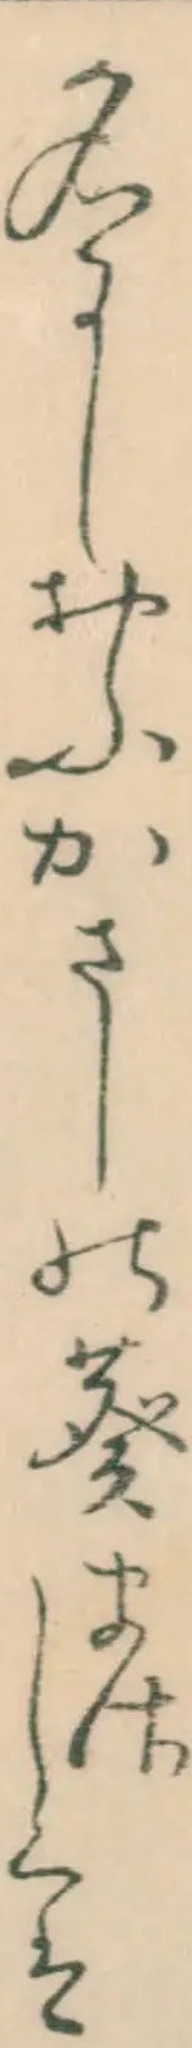名にしおふかさしの葵まさしくは
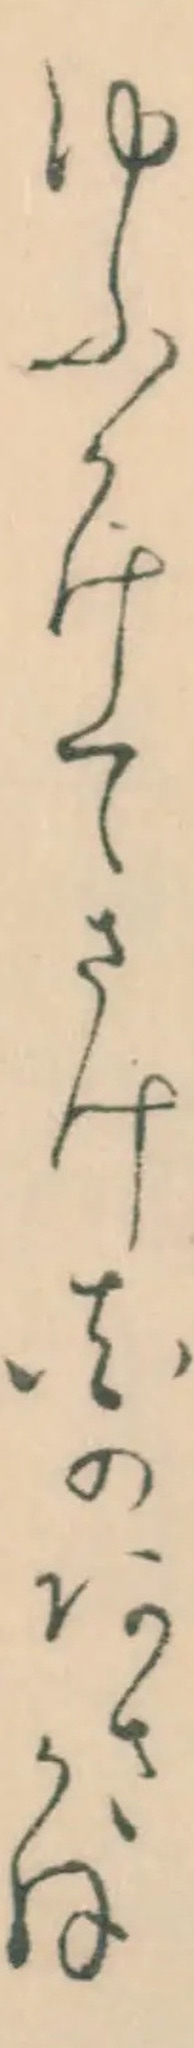ゆふかけてさけ花のあさかほ尚監
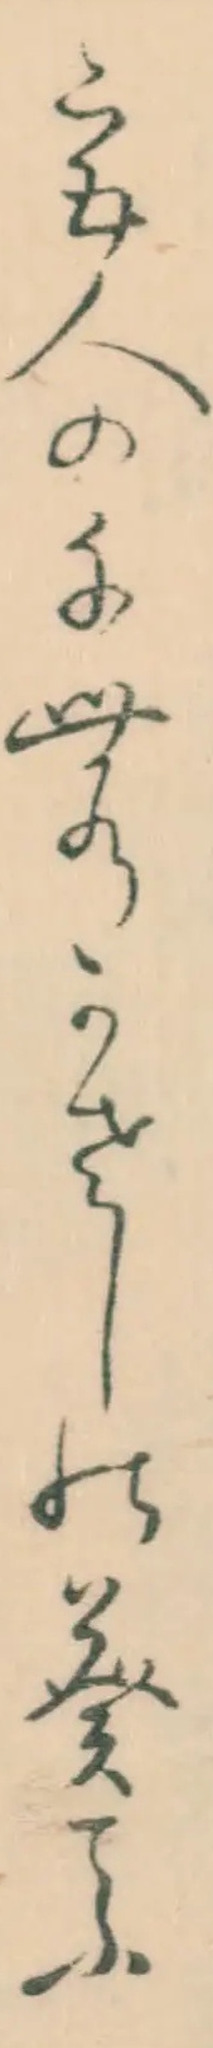宮人の千世のかさしの葵てふ
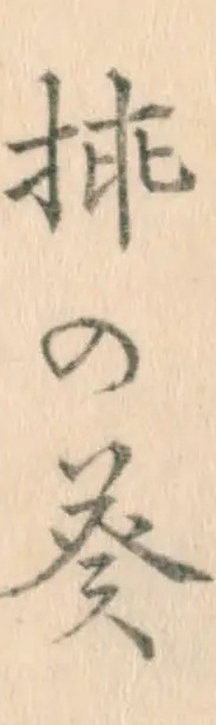插の葵
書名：花壇朝顔通 2巻. [1]
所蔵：国立国会図書館 National Diet Library, JAPAN
